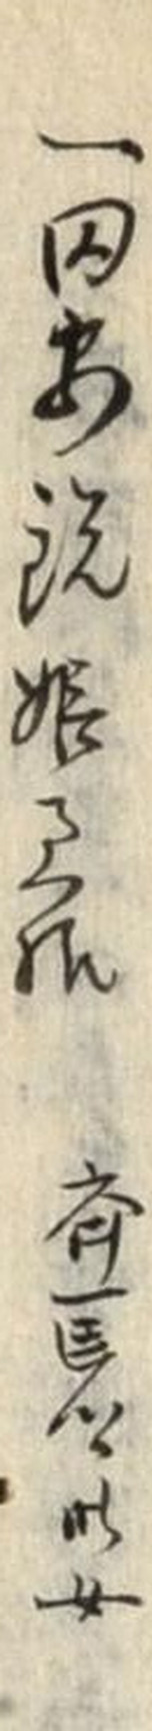一田安鋭姫君様斉匡卿御女
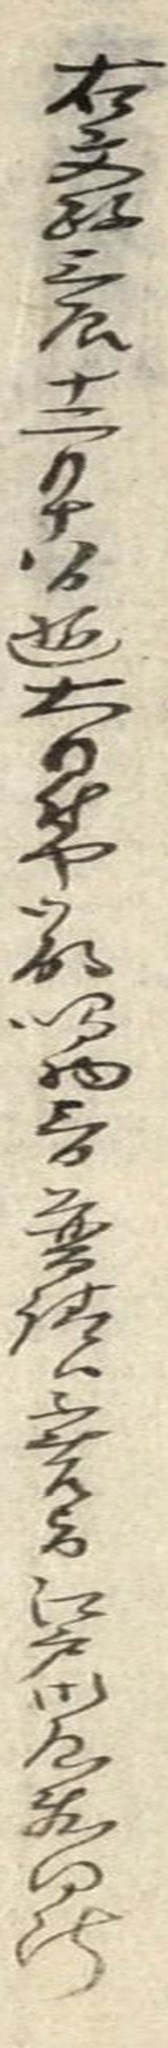右文政三辰十二月十八日逝大目付中御触鳴物三日普請は不苦旨江戸御屋敷同断
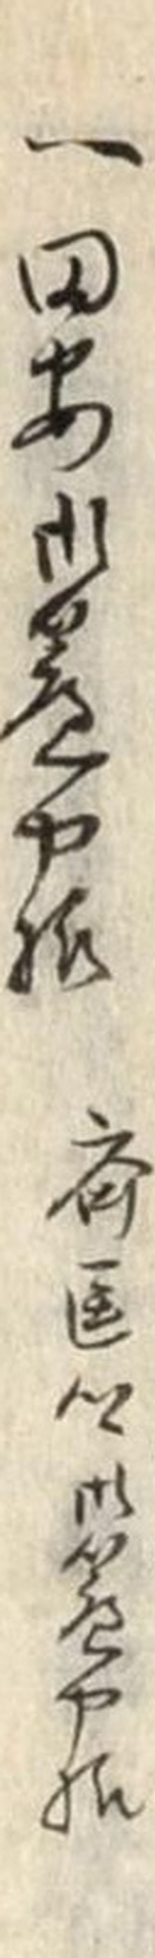一田安御簾中様斉匡卿御簾中様
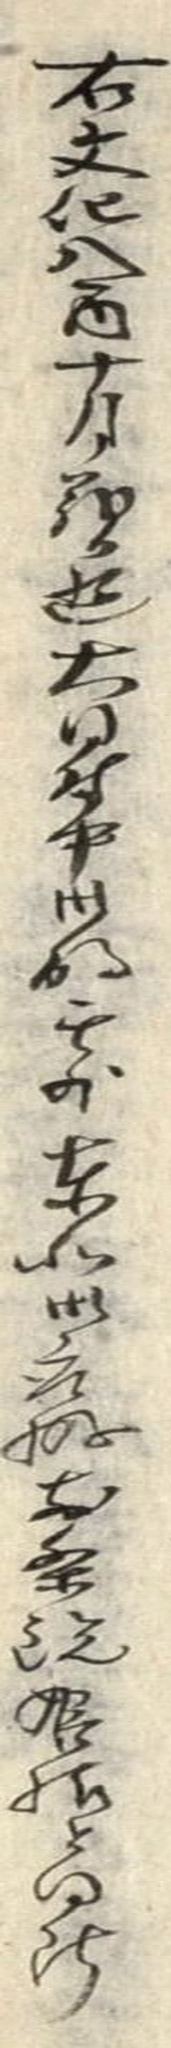右文化八酉十月朔日逝大目付中御触其外東北御取扱前条鋭姫様と同断
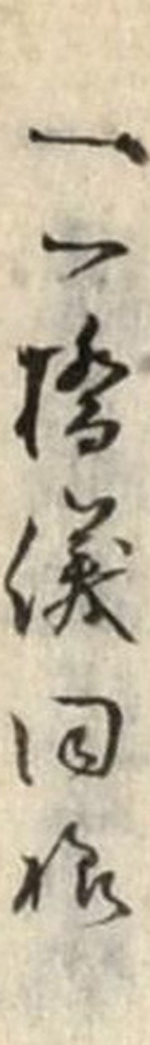一一橋儀同様

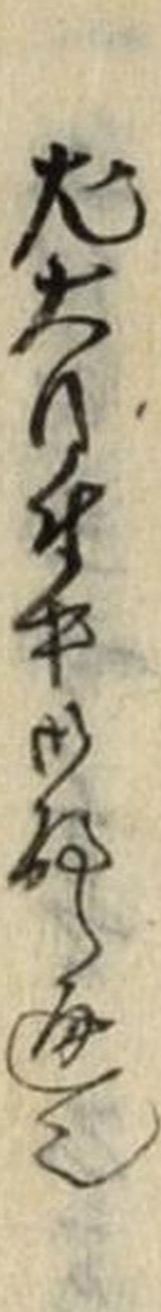尤大目付中御触候通也
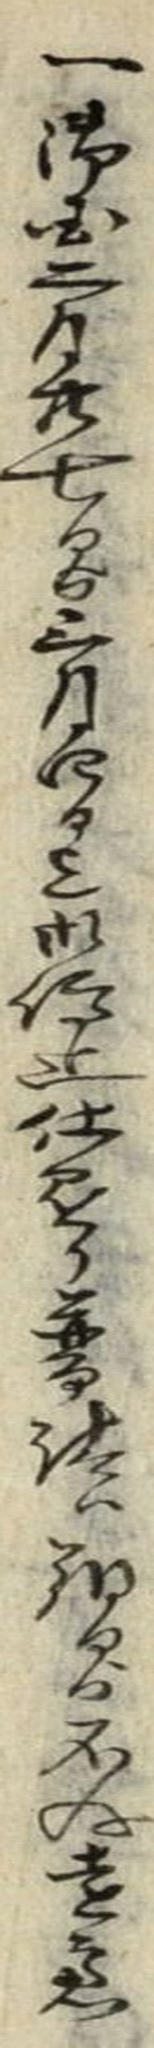一御国二月廿七日ゟ三月四日迄御停止仕懸り普請は朔日ゟ不及遠慮
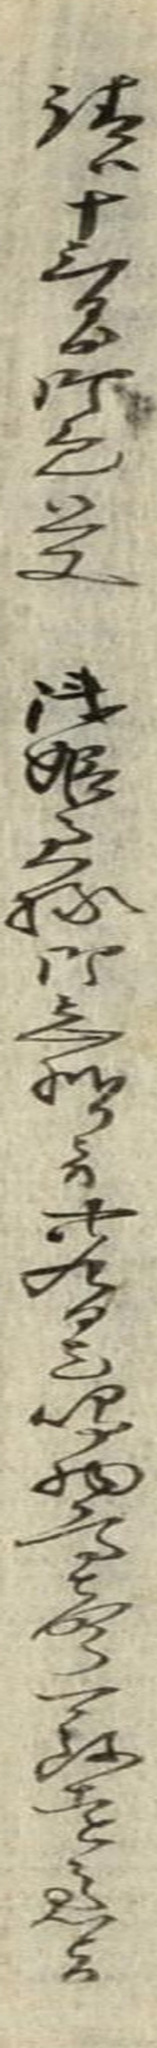請は十三日ゟ御免且又浅姫君様御忌掛りに付廿九日迄鳴物高声可致遠慮旨
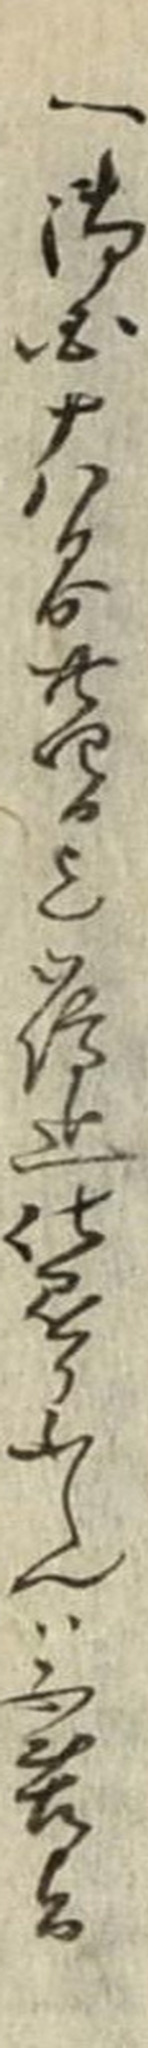一御国十八日ゟ廿四日迄御停止仕懸り普請は不苦旨
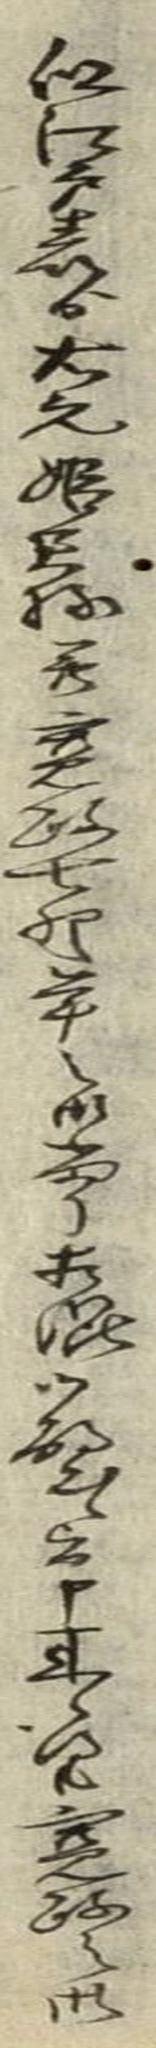但江戸表ゟ右元姫君様并寛政七卯年之御当り相混御触出候旨申来候得共寛政之御
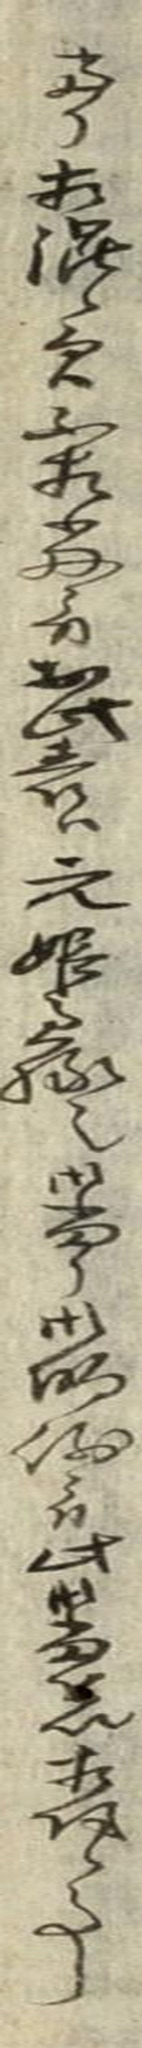当り相混候而は不相当に付於此表は元姫君様之御当り御的例に付此御当を以相伺候事
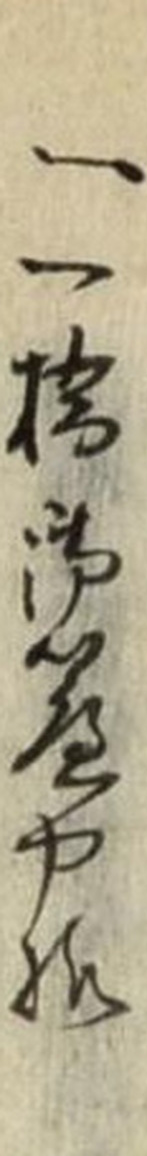一一橋御簾中様
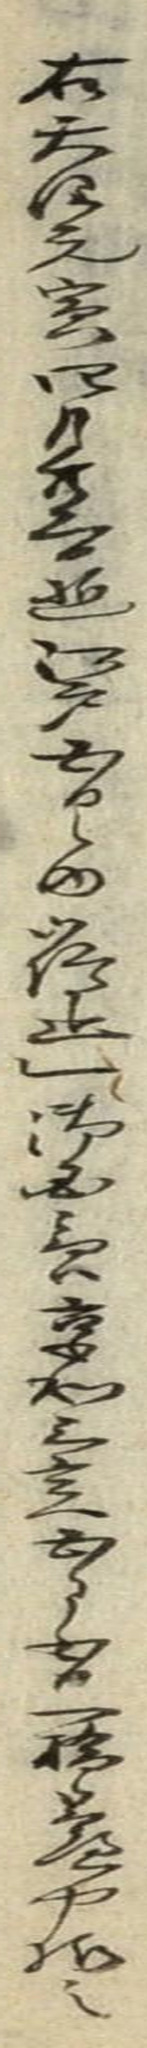右天保元寅四月廿ニ日逝江戸五日之内御停止」御国にては享和三亥五月五日一橋御簾中様之
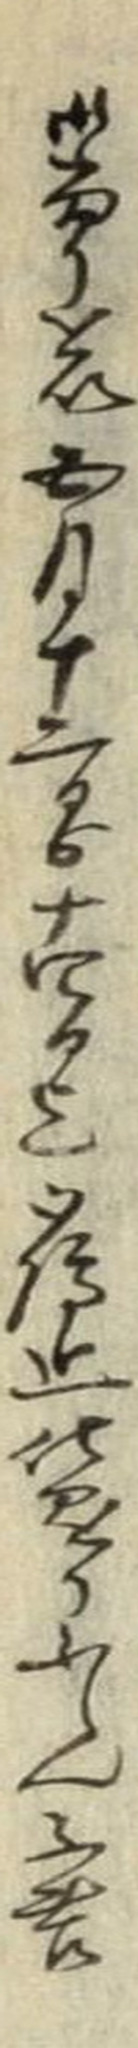御当りを以五月十二日ゟ十四日迄御停止仕懸りふしん不苦
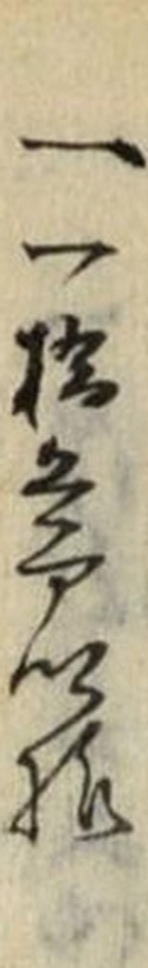一一橋兵部卿様
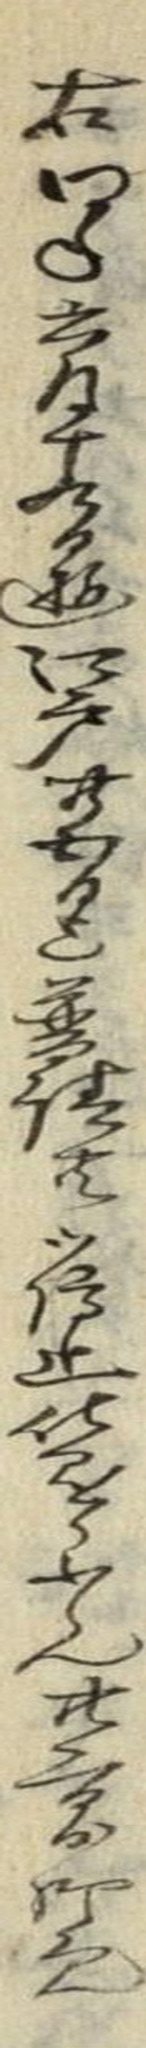右同年六月十九日逝江戸廿五日迄普請共御停止仕懸りふしん廿二日ゟ御免
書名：御停止異変死失
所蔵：福井県文書館 Fukui Prefectural Archives
